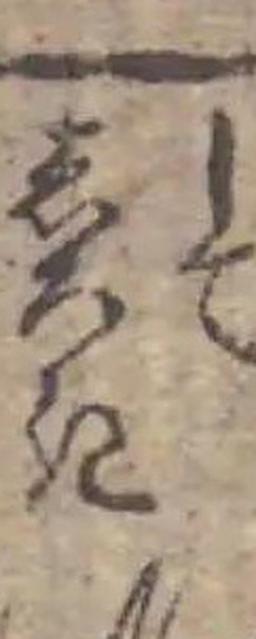しろき
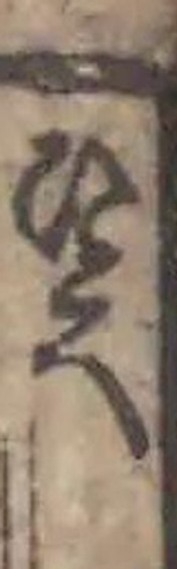ひとへ
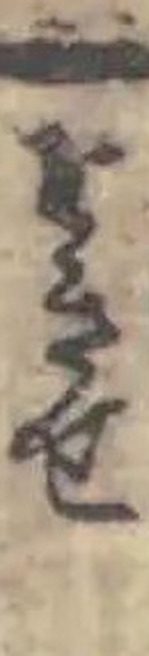をきせ
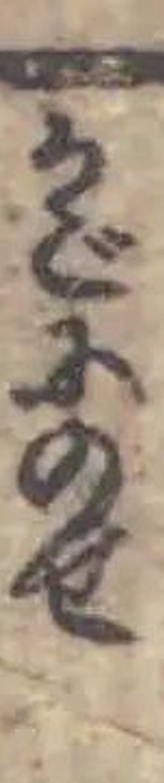かごにのせ
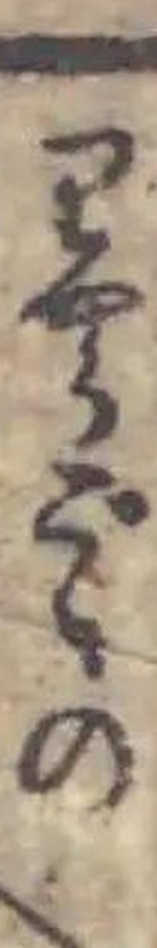りやうごくの
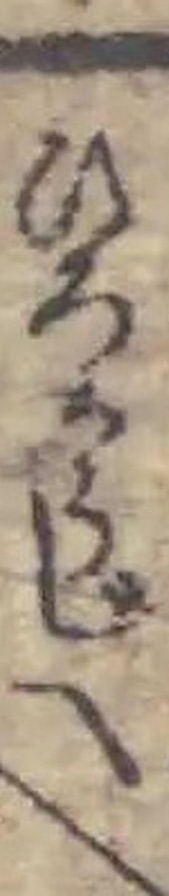ひろかうじへ
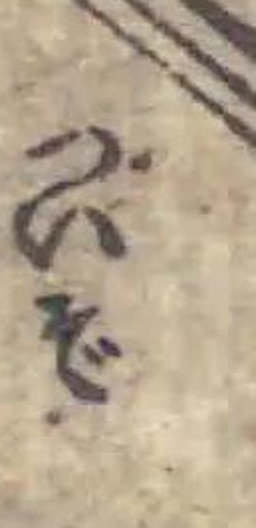ついぞ
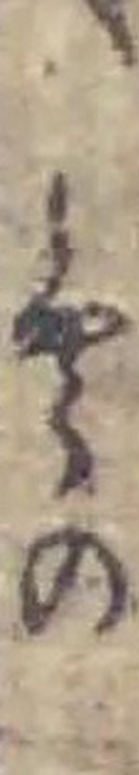しやうの

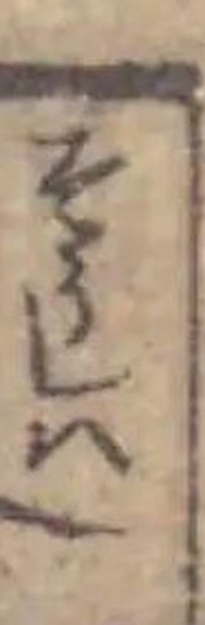そうしは
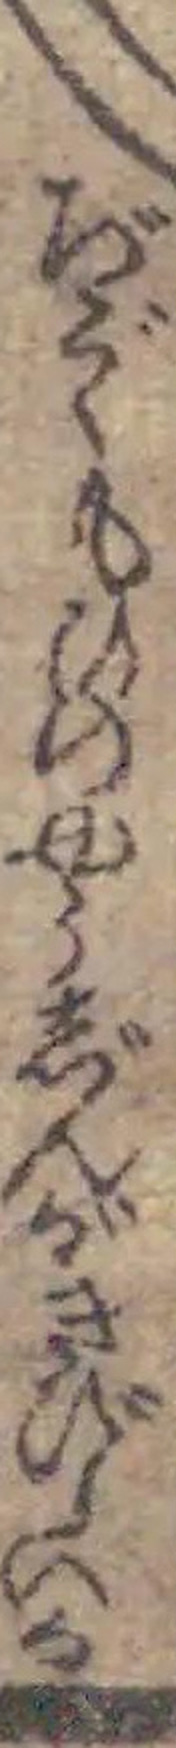ぢごくもひのやうじんがきびしいか
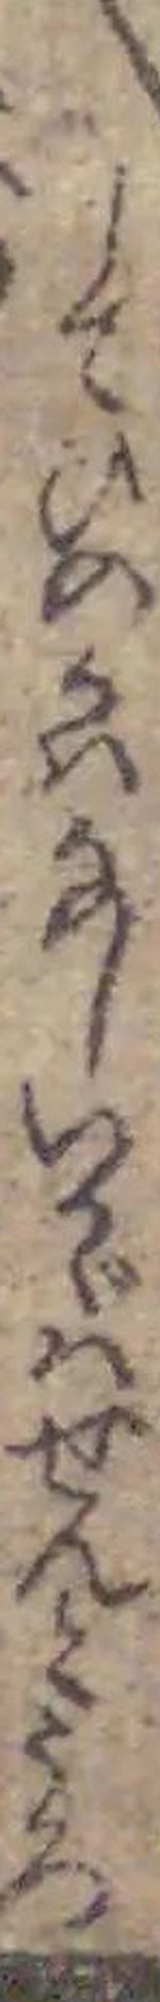してひのかいなしいかゞはせんとうろ
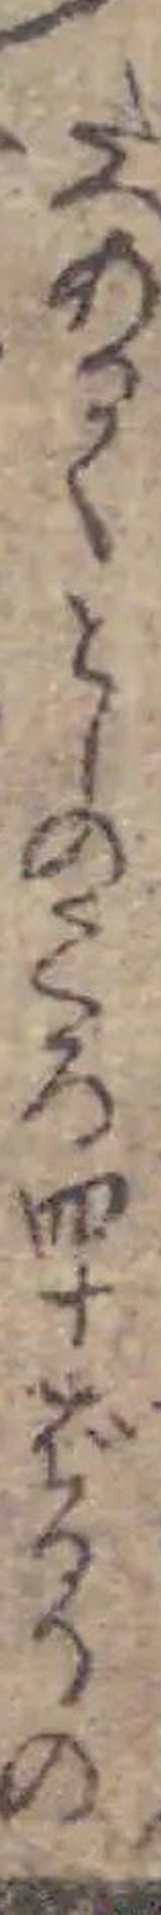たへあるくとしのころ四十ばかりの
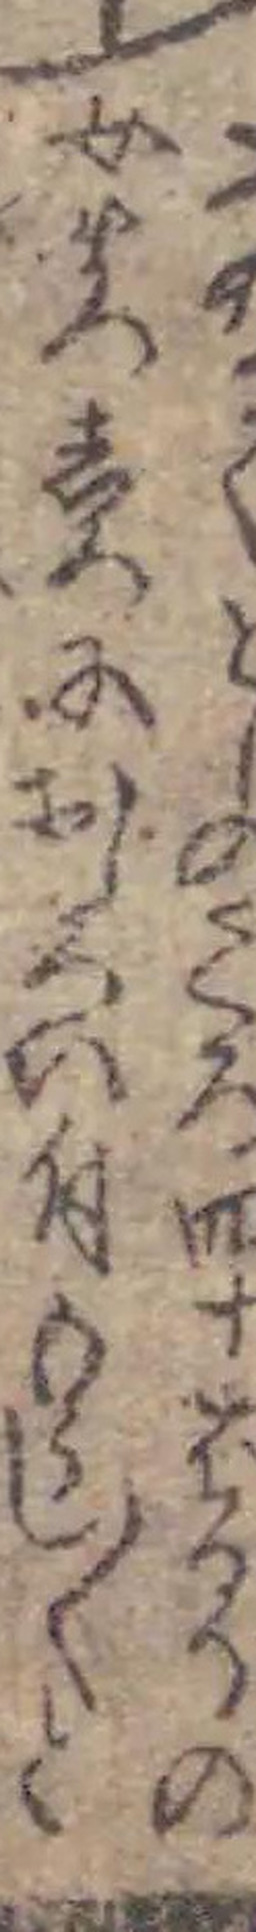女まつしろにおしろい付もうし〳〵と
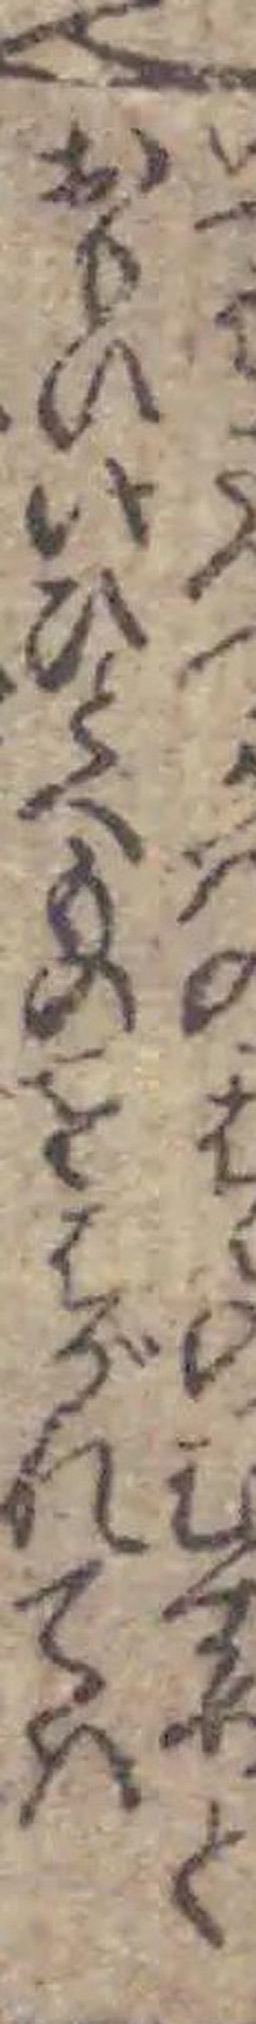おもひ此ひとへものをはがれては
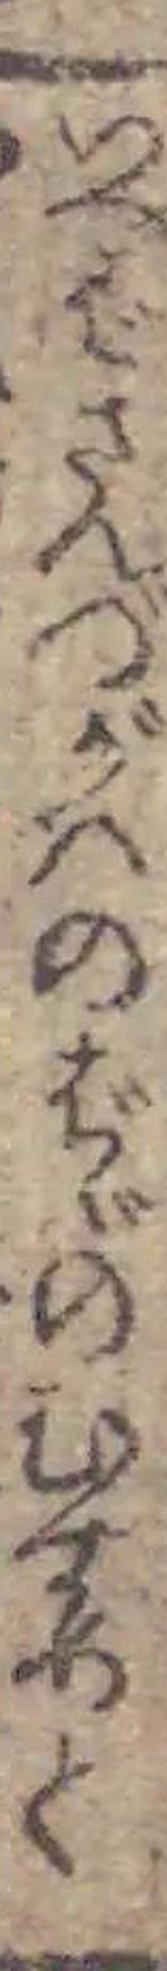いへばさんづがはのばゞのむすめと
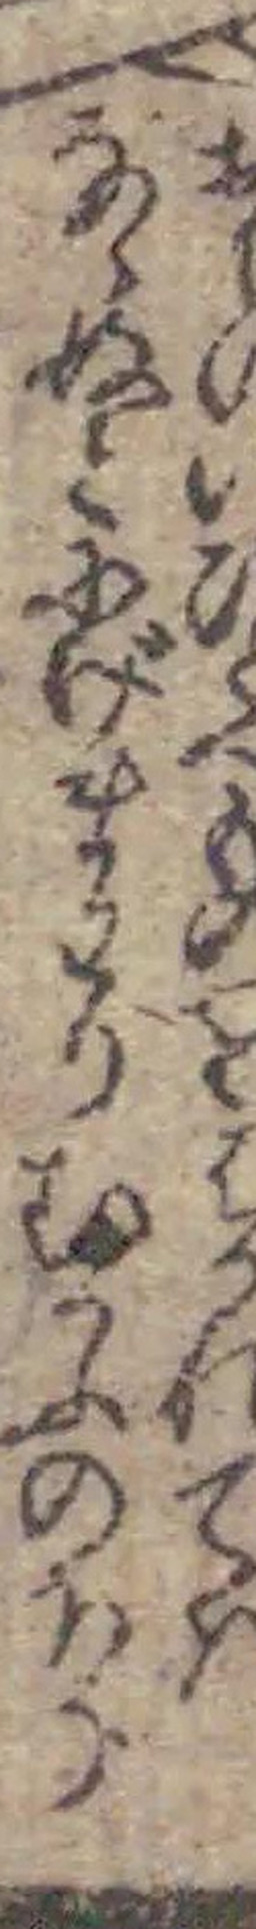ならぬとにげまわりむかふのほう
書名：飲中八人前 3巻
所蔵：国立国会図書館 National Diet Library, JAPAN
